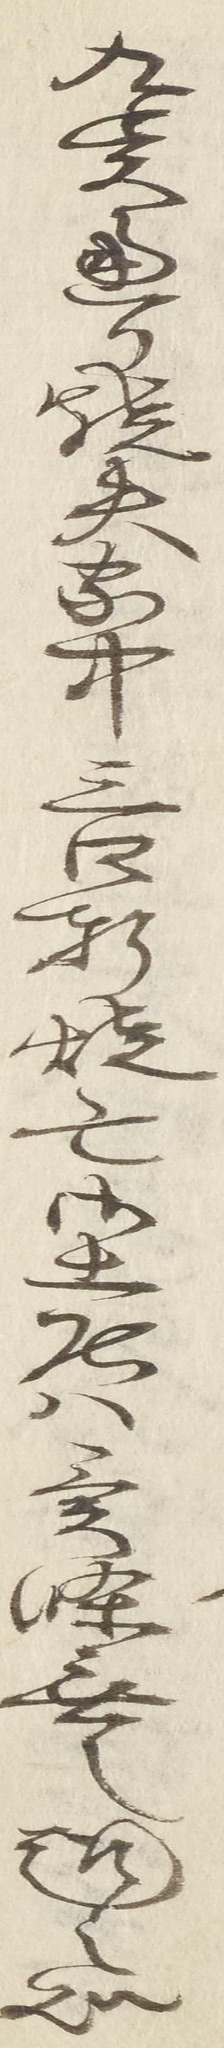九歩通り焼失家中三四軒焼亡御土居は異條無之趣之処
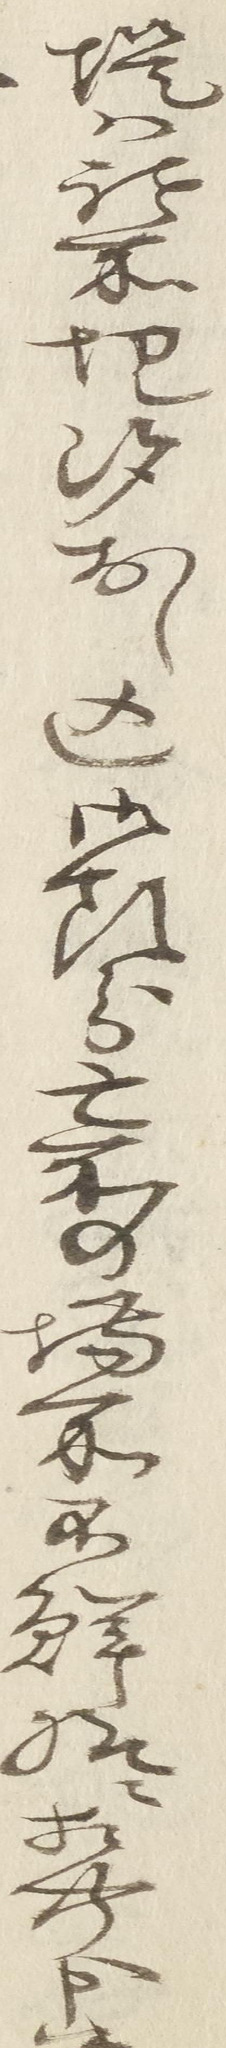堤は諸所切ㇾ汐おし込御領分亡所の場所不鮮様に相聞へ申候
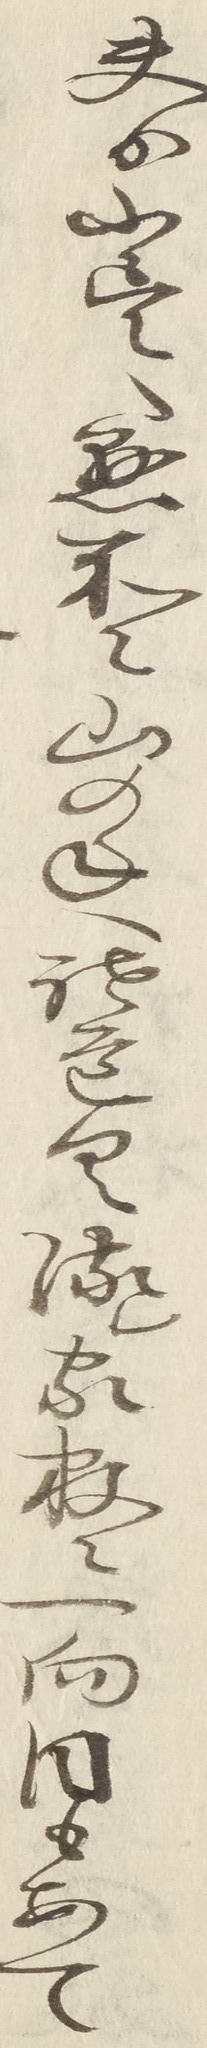夫ゟ小尽へ懸所々山の手へ諸道具流ㇾ家数々目もあて
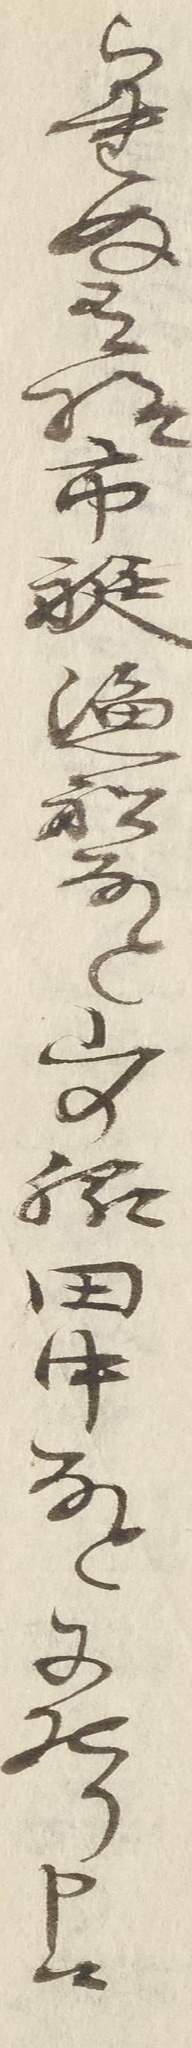られぬ有様市艇漁船なと山の脇田中なとに居り申候
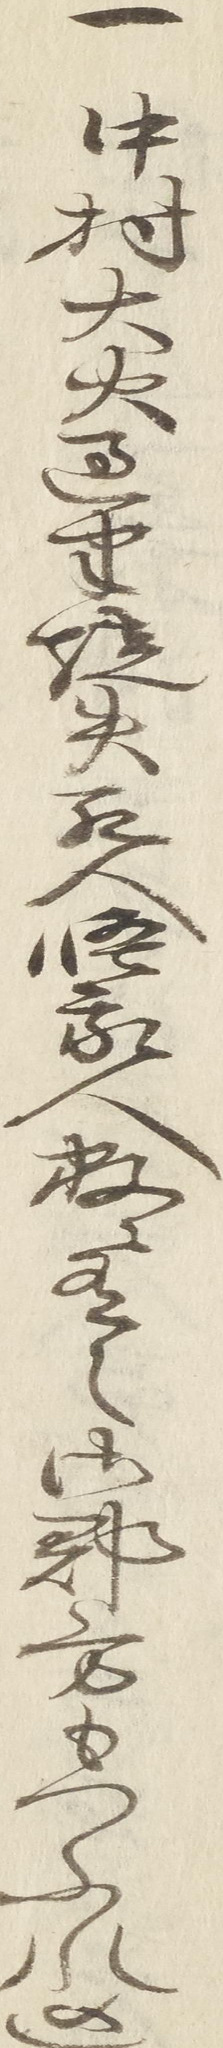一中村大火過半焼失死人怪我人数々有之御郡方もつふれ込
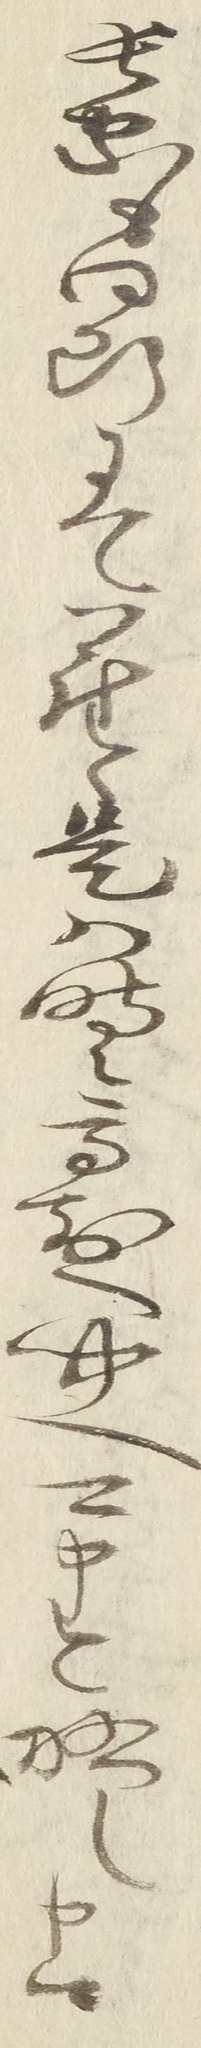長家も同断にて御座候是は時の高知へ聞へ可申と咄し申候
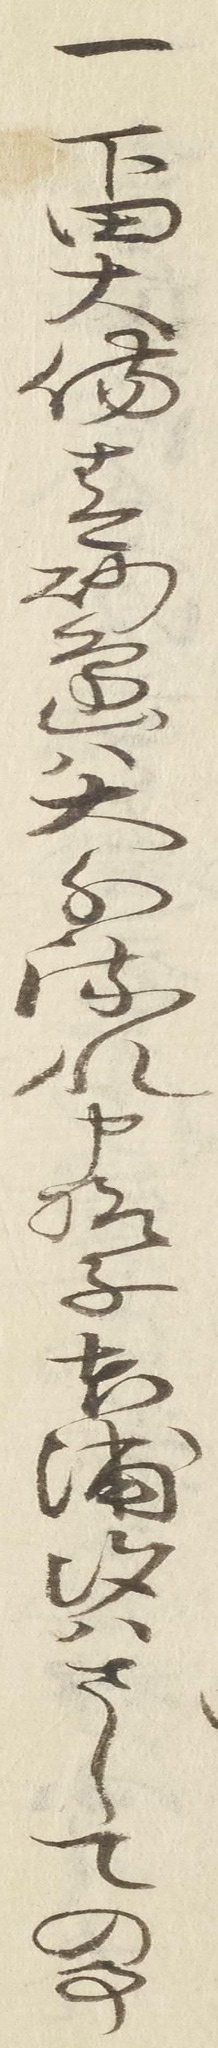一下田大傷青砂島は大分流れ申様子本浦汐はさしての事
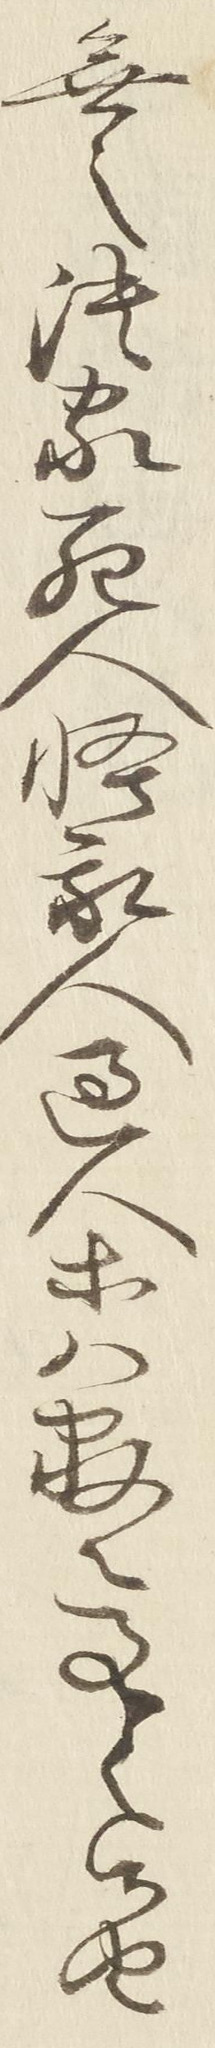無之潰家死人怪我人過人等は数々事にて候由
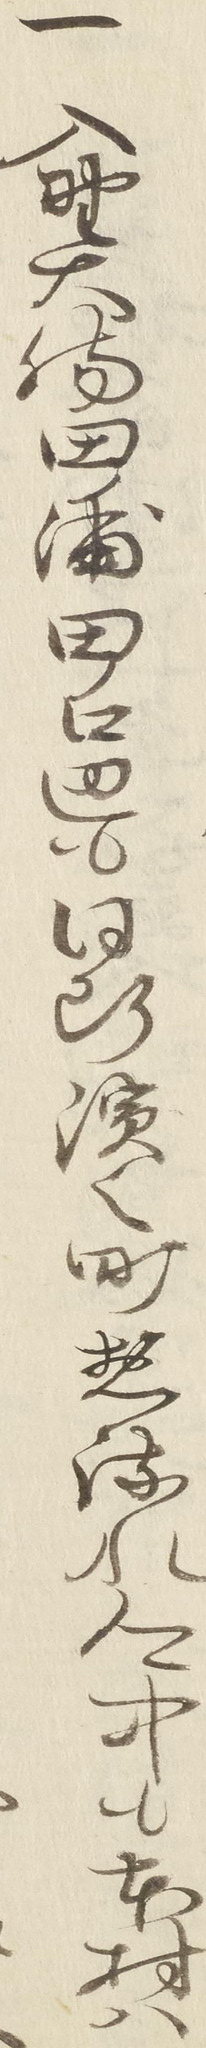一入野大傷田ノ浦田ノ口辺も同断浜之町惣流れ郷中も本村は
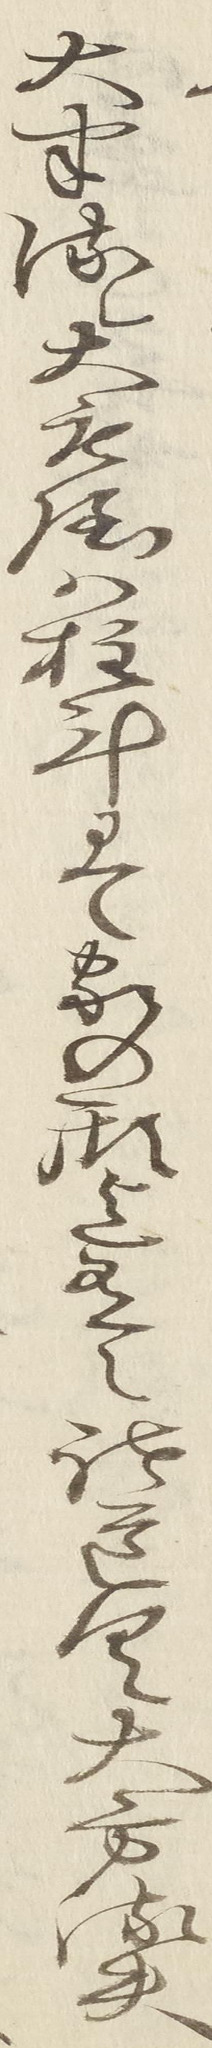大半流ㇾ大庄屋は柱斗にて家の軒迄有之諸道具大方流失
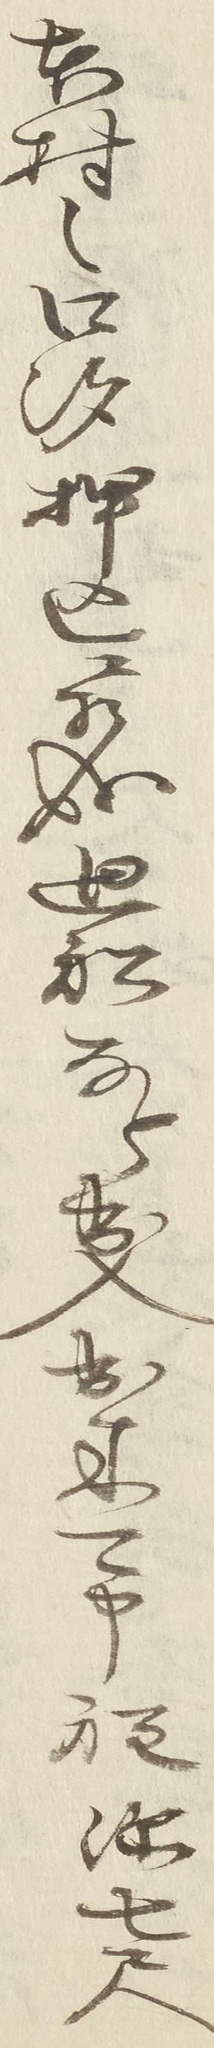本村の口汐押込に相成廻船なと出入出来可申程深七尺
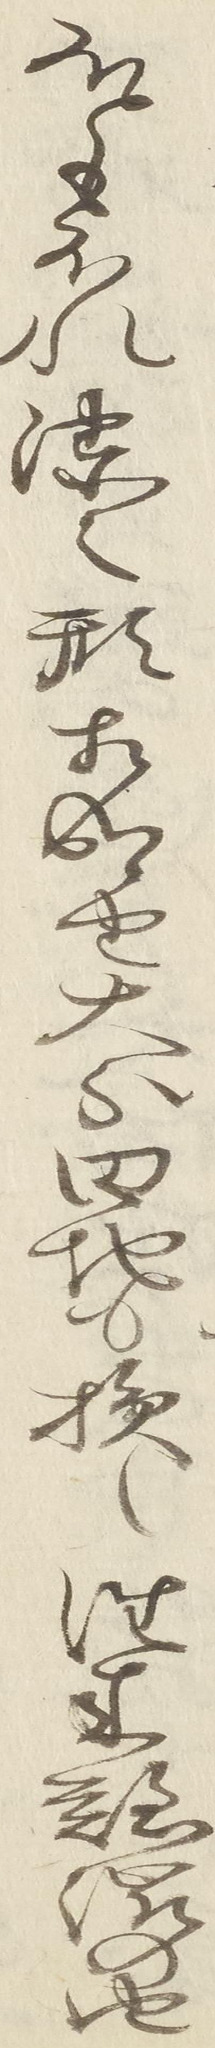ほともほれ湊之形相成候由大分田地も損し往来難渋の由
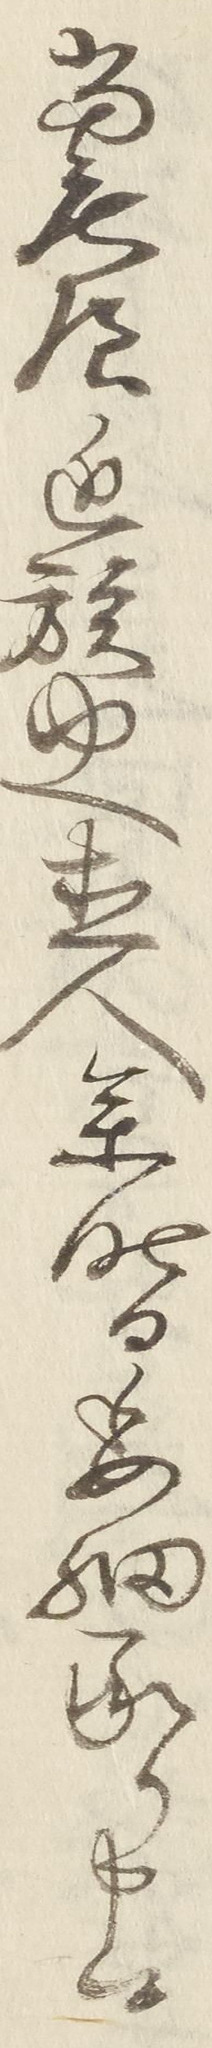当庄屋近族ゆへ直人参昨日委細承り申候
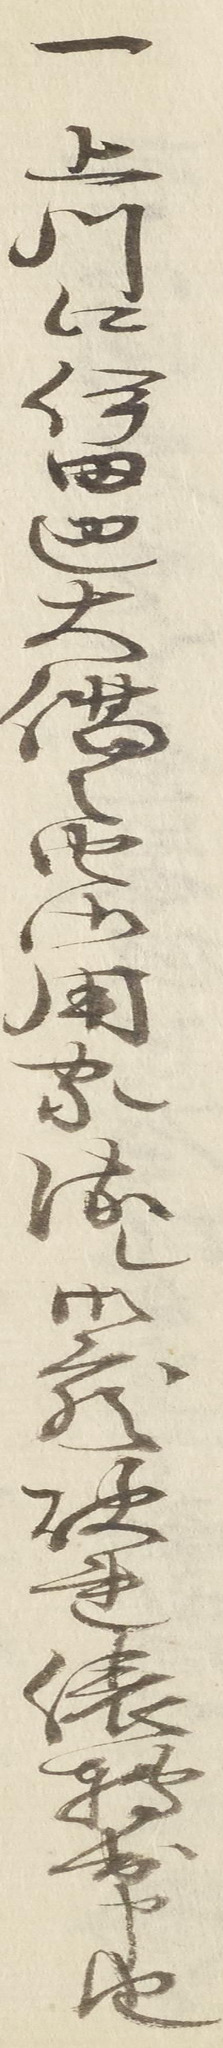一上川口伊田辺大傷之由御用家流れ御蔵破れ俵転出申由
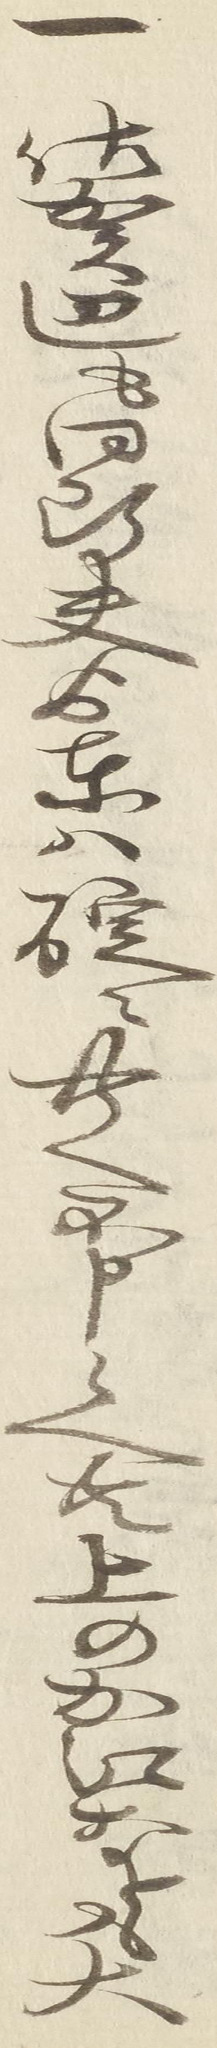一佐賀辺も同断夫ゟ東は聢と聞へ不申候へ共上のか江なとも大
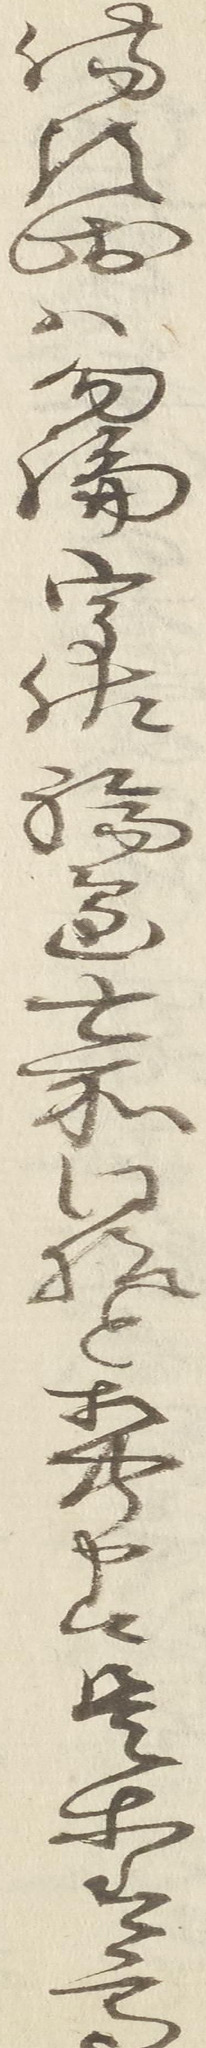傷須崎は勿論宇佐福島亡所同様と相聞申候是等は高
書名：地震記　下
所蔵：東京大学地震研究所図書室 Earthquake Research Institute Library, The University of Tokyo, JAPAN
